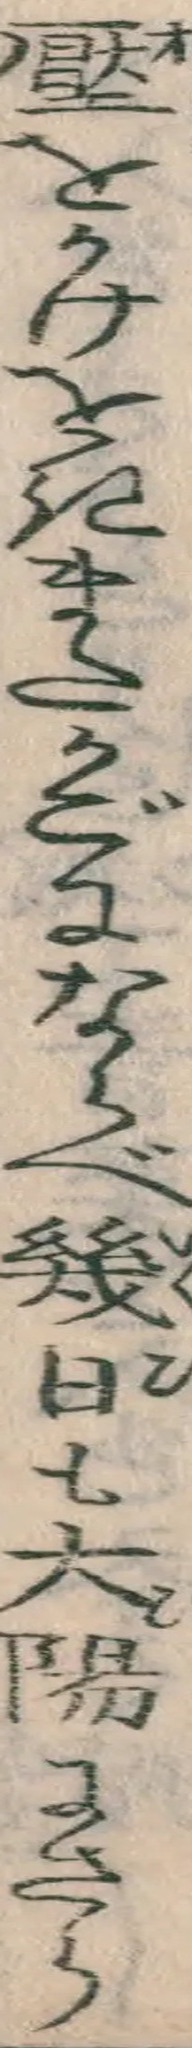壓をかけをきまたかごにならべ幾日も大陽にさら
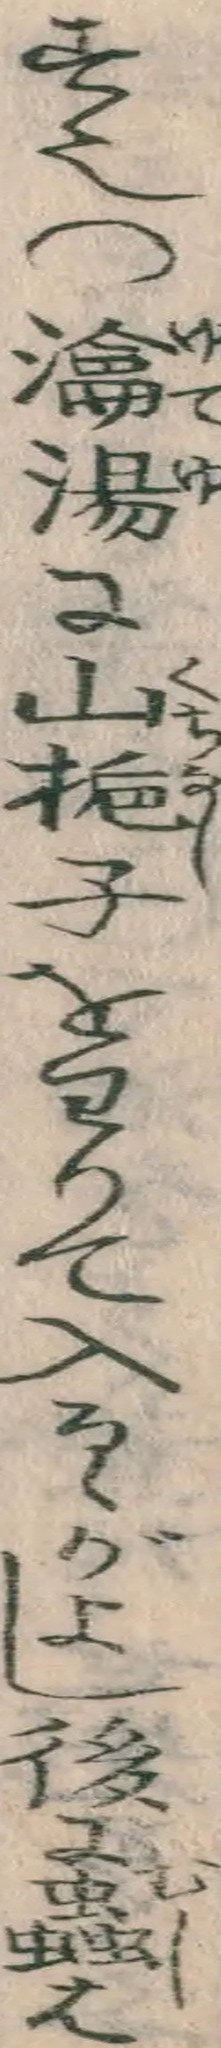す也○瀹湯に山梔子をわりて入るゝがよし後に蟲は
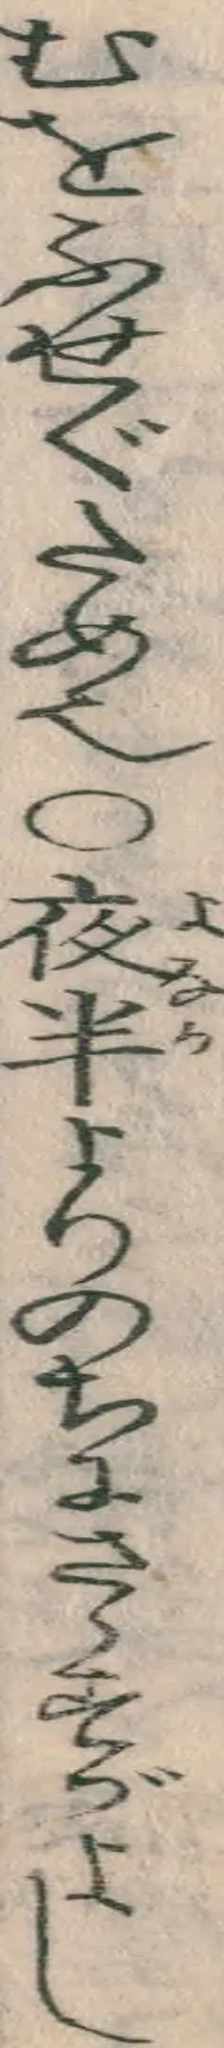むをふせぐため也○夜半よりのちにさらすがよし
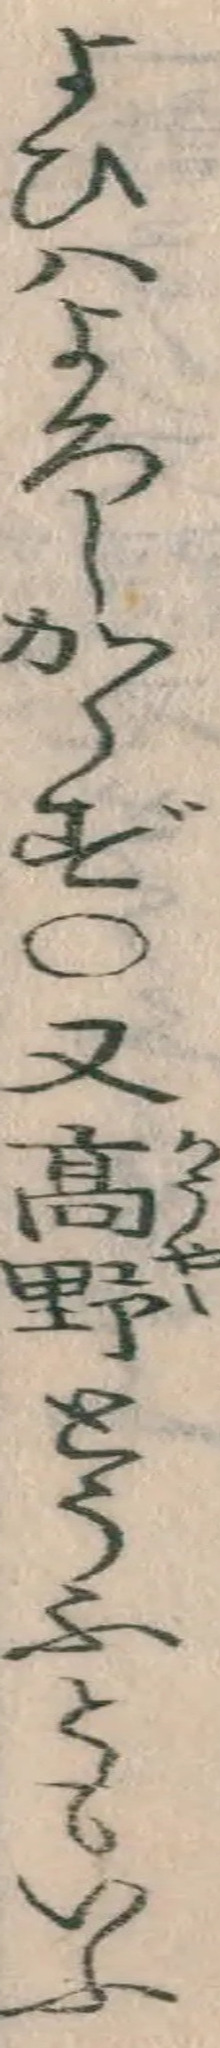よひはよろしからず○又髙野とうふともいふ
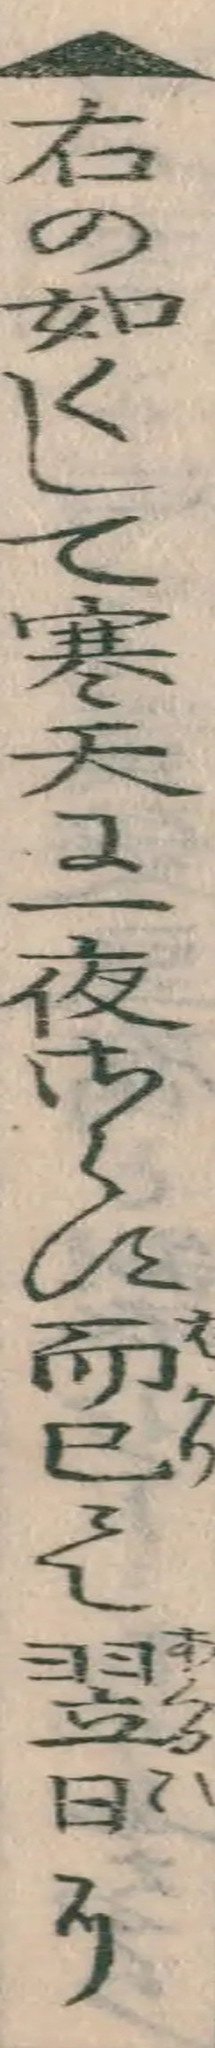▲右の如くして寒天に一夜さらす而已にて翌日に
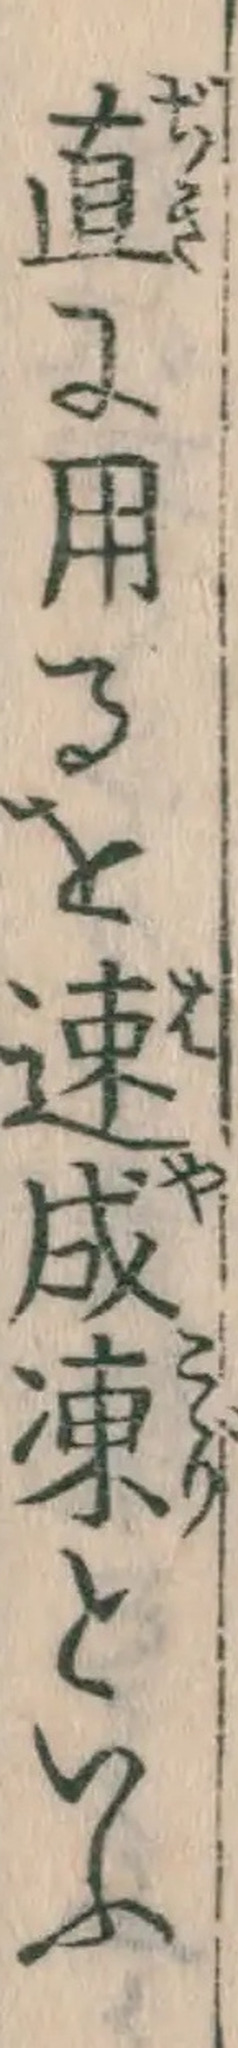直に用るを速成凍といふ
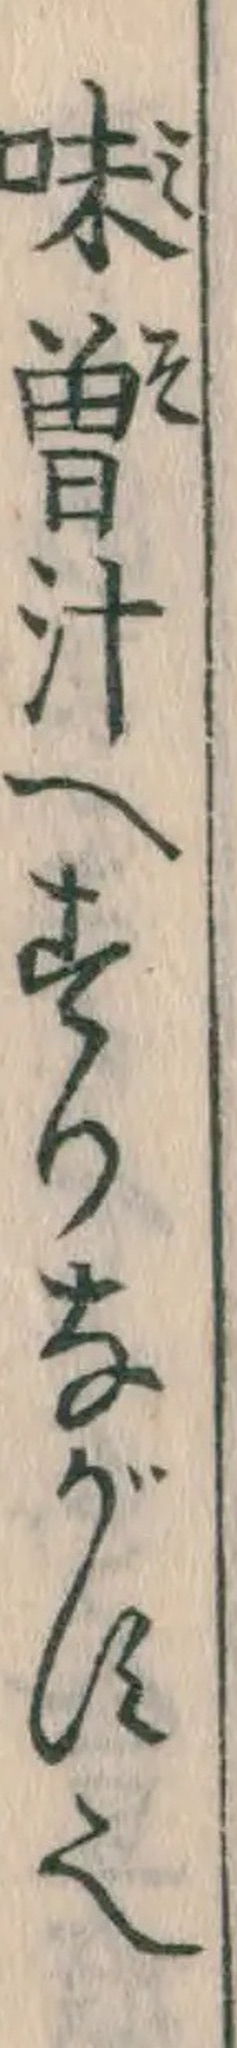味曾汁へすりながす也
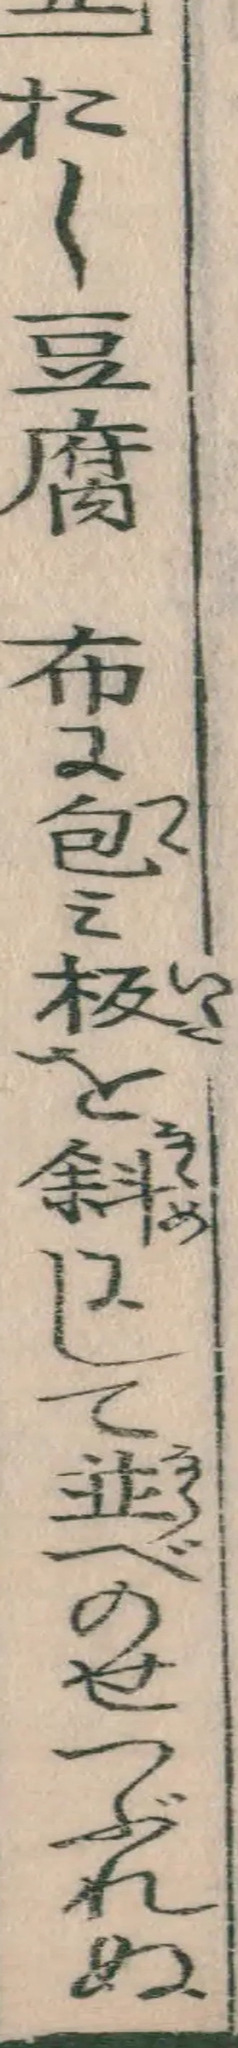[十五]おし豆腐布に包み板を斜にして並べのせつぶれぬ
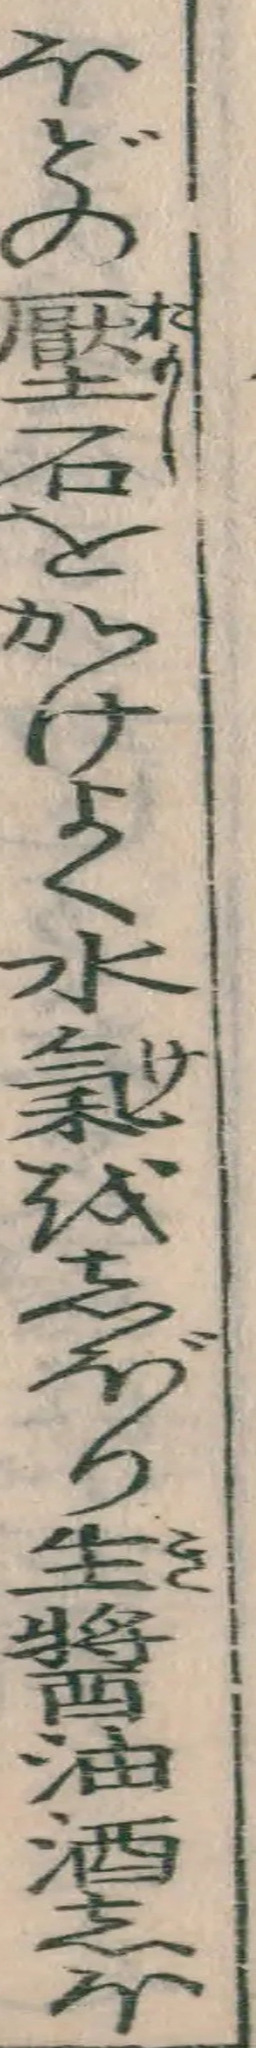ほどの壓石をかけよく水氣をしぼり生醤油酒しほ
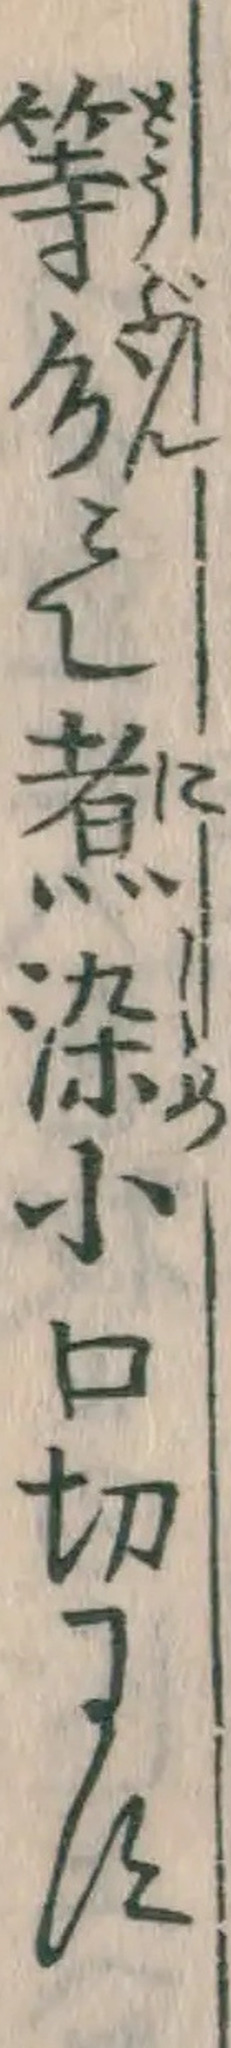等分にて煮染小口切にす

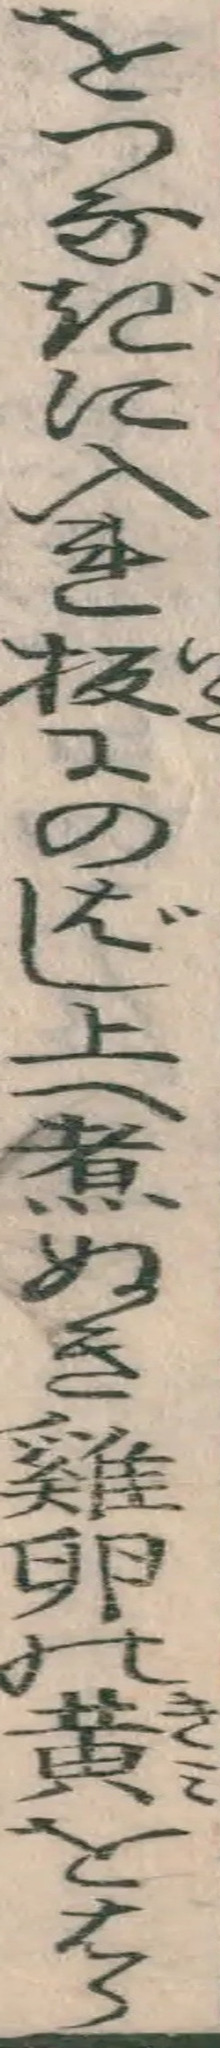をつなぎに入れ板にのばし上へ煮ぬき雞卵の黄をはら
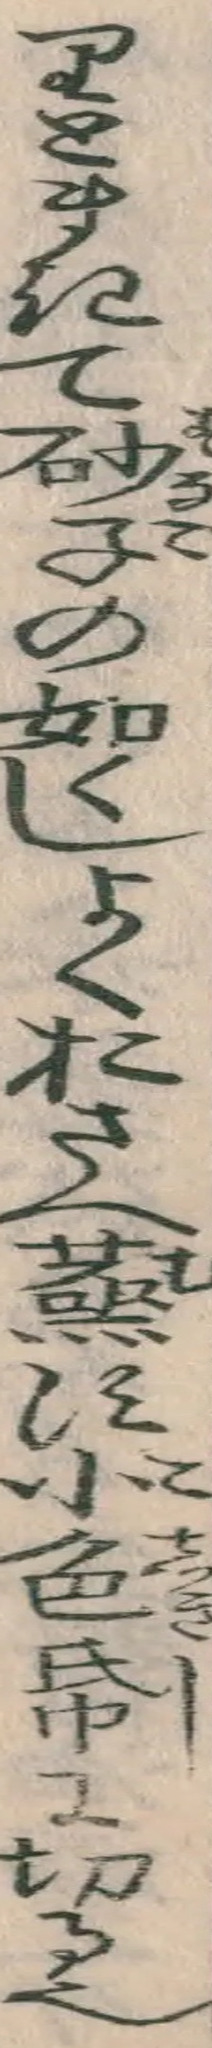りとまきて砂子の如くしよくおさえ蒸す小色帋に切る也
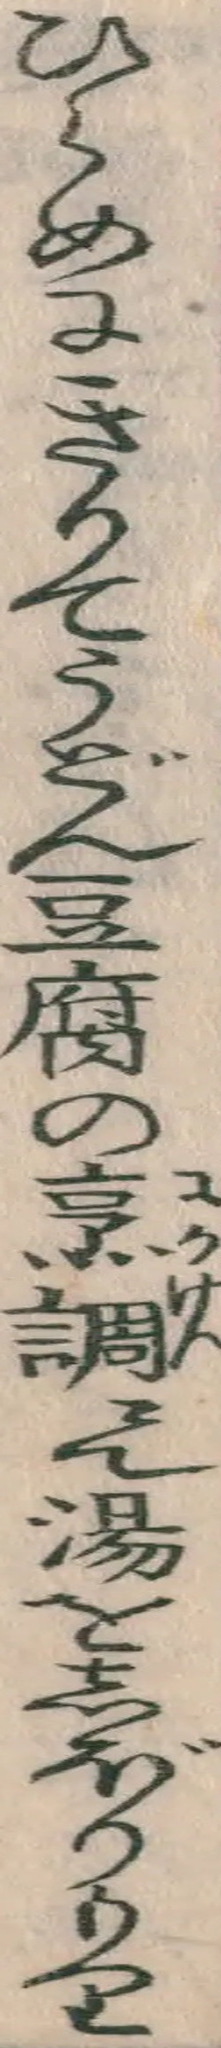ひらめにきりてうどん豆腐の烹調にて湯をしぼりもり
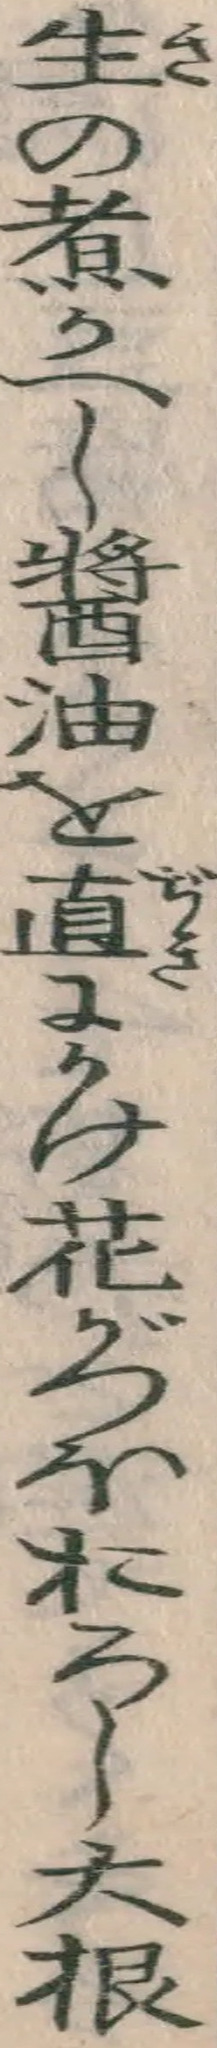生の煮かへし醤油を直にかけ花がつほおろし大根
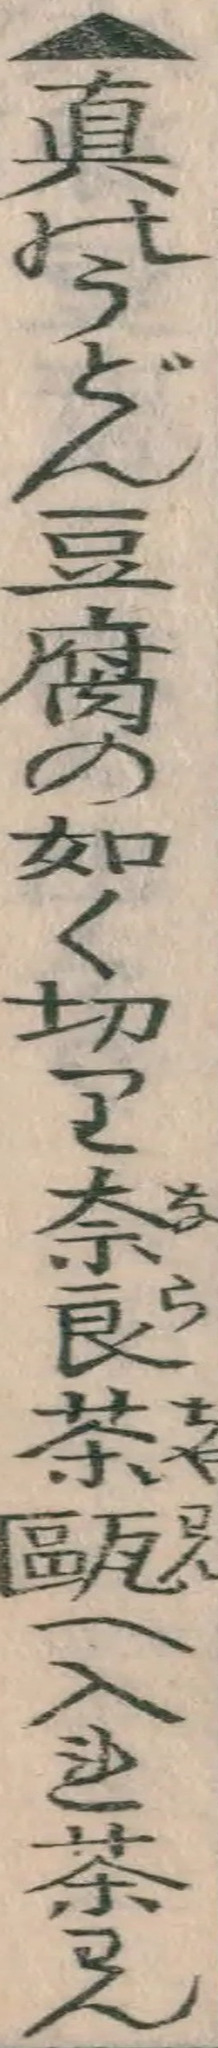▲眞のうどん豆腐の如く切り奈良茶甌へ入れ茶わん
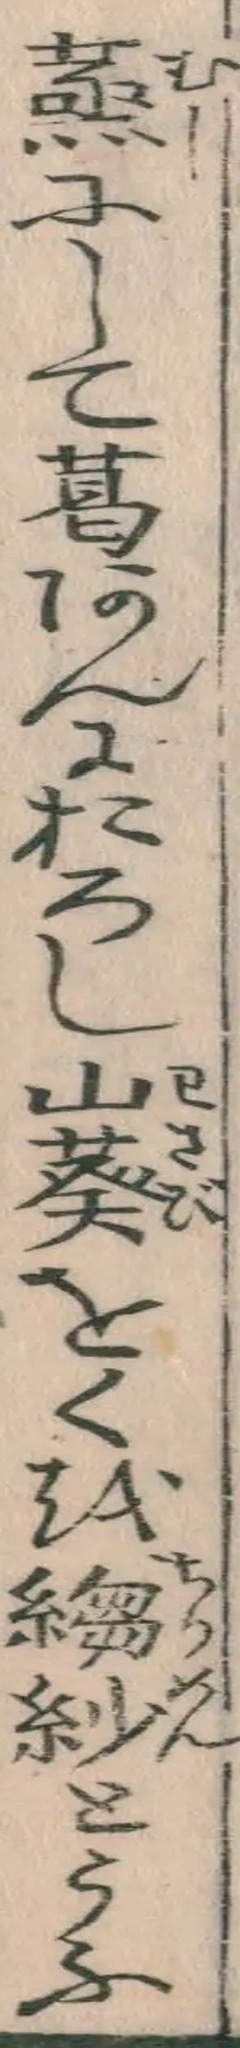蒸にして葛あんにおろし山葵をくを縐紗とうふ
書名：豆腐百珍. [正編]
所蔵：国立国会図書館 National Diet Library, JAPAN
